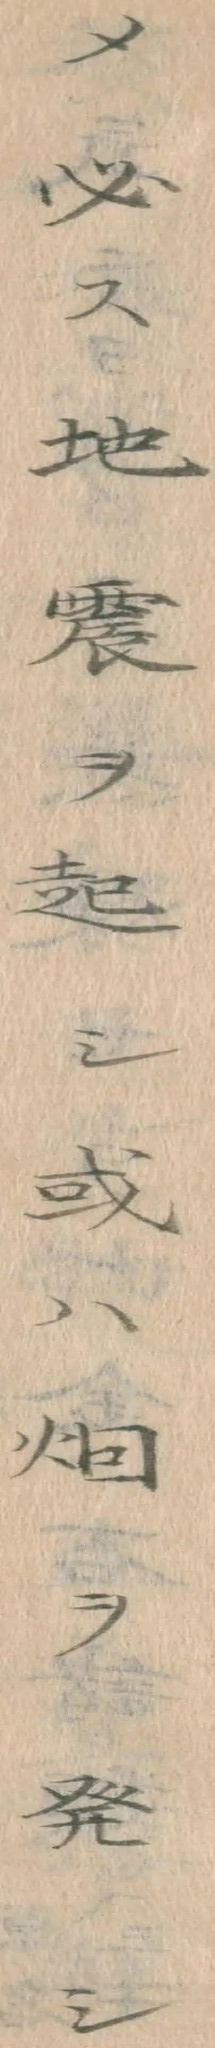メ必ス地震ヲ起シ或は𤇆ヲ発シ
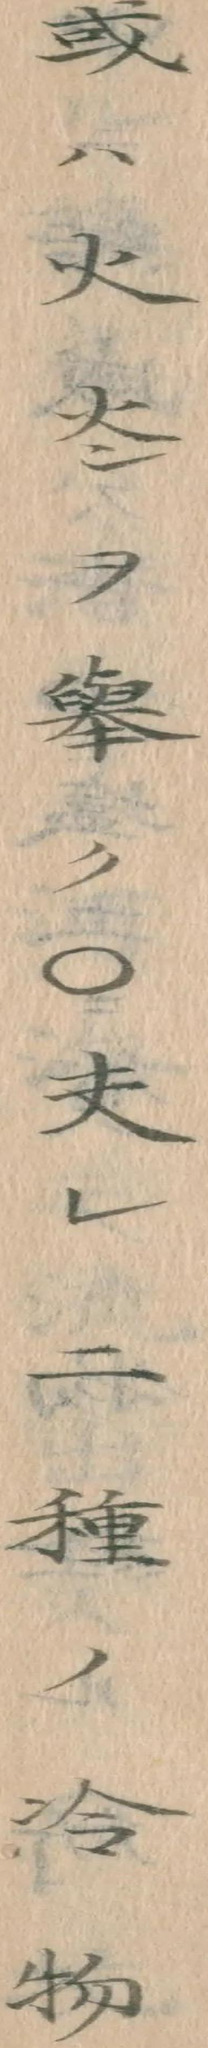或ハ火炎ヲ挙ク○夫レ二種ノ冷物
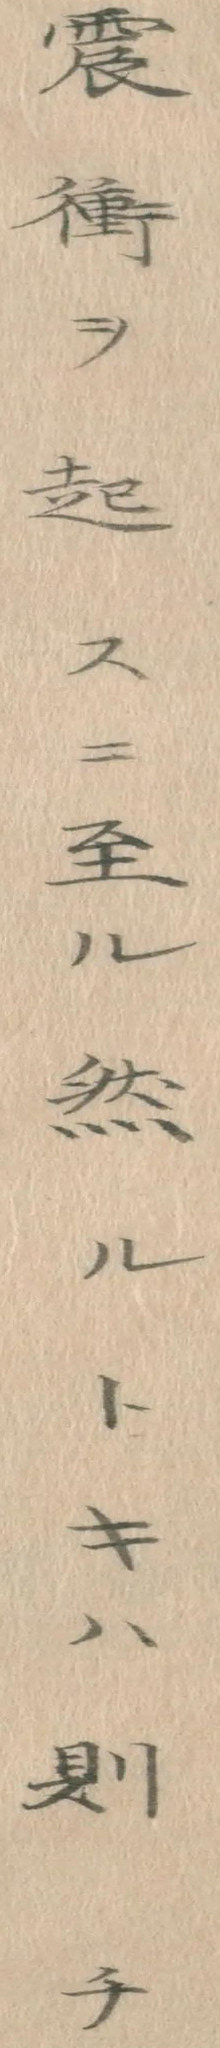震衝ヲ起スニ至ル然ルトキハ則チ
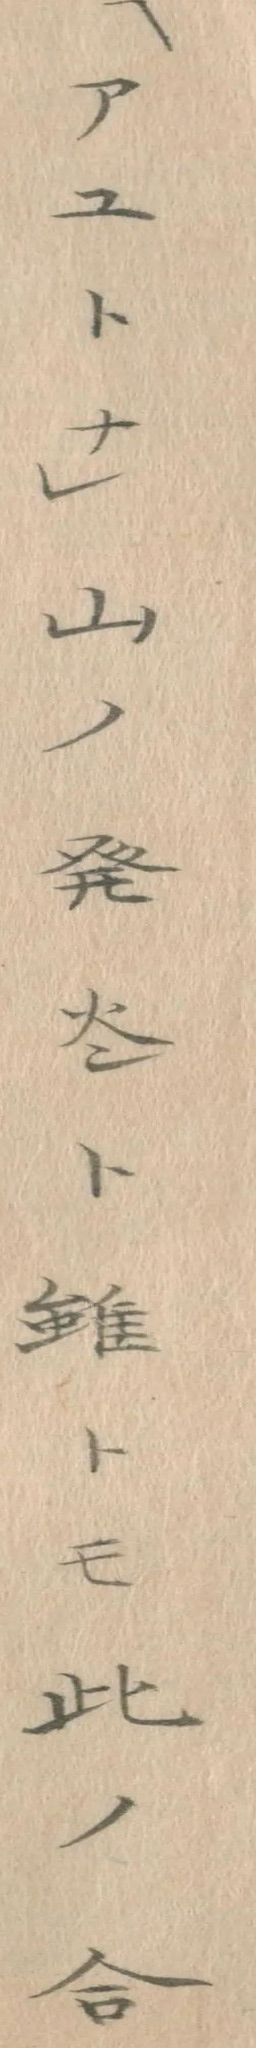「アユトナ」山ノ発炎ト雖トモ此ノ合
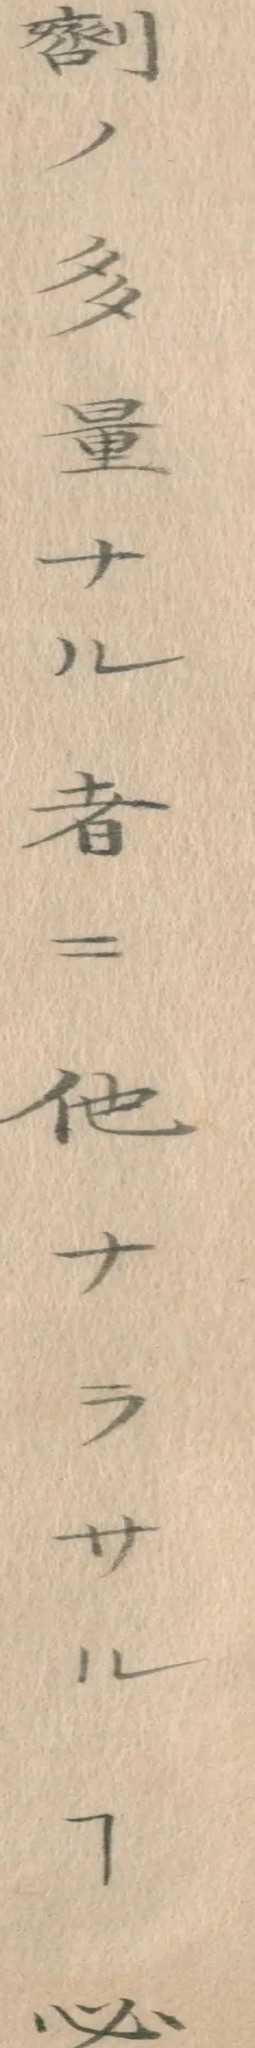剤ノ多量ナル者ニ他ナラサル事必
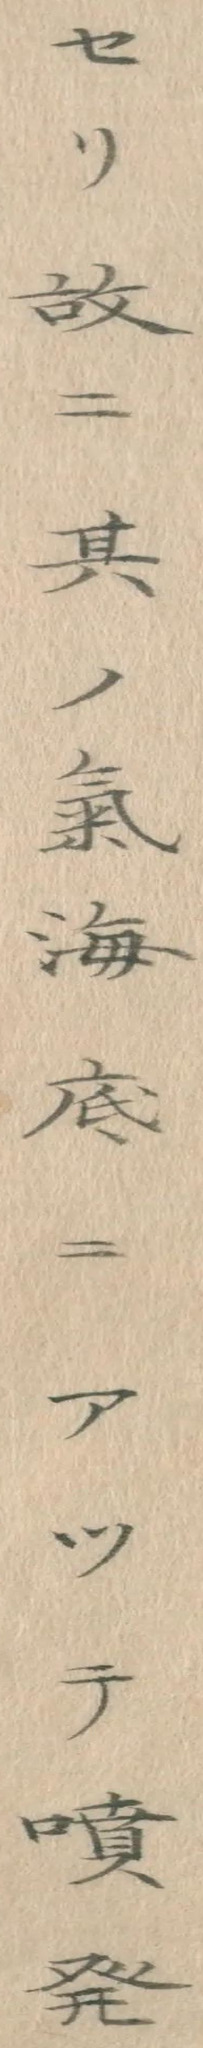セリ故ニ其ノ気海底ニアツテ噴発
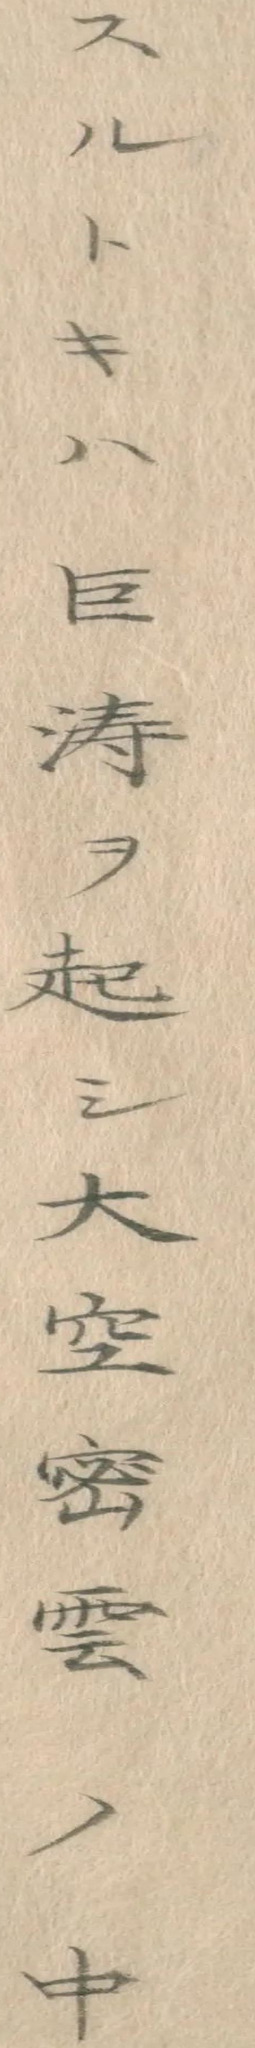スルトキハ巨涛ヲ起シ大空密雲ノ中
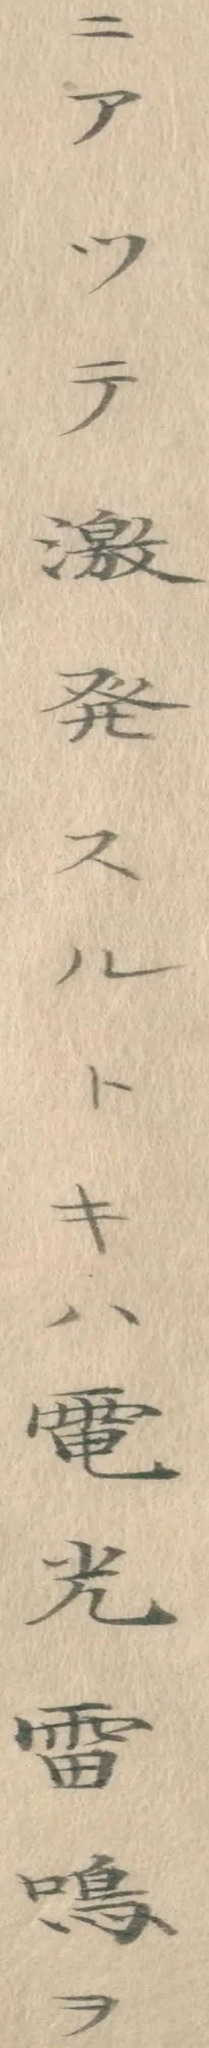ニアツテ激発スルトキハ電光雷鳴ヲ

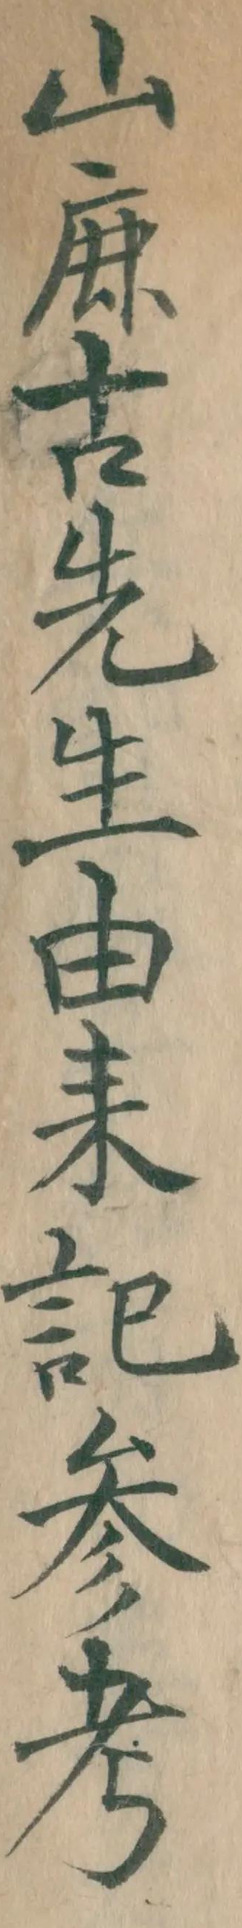山鹿古先生由来記参考

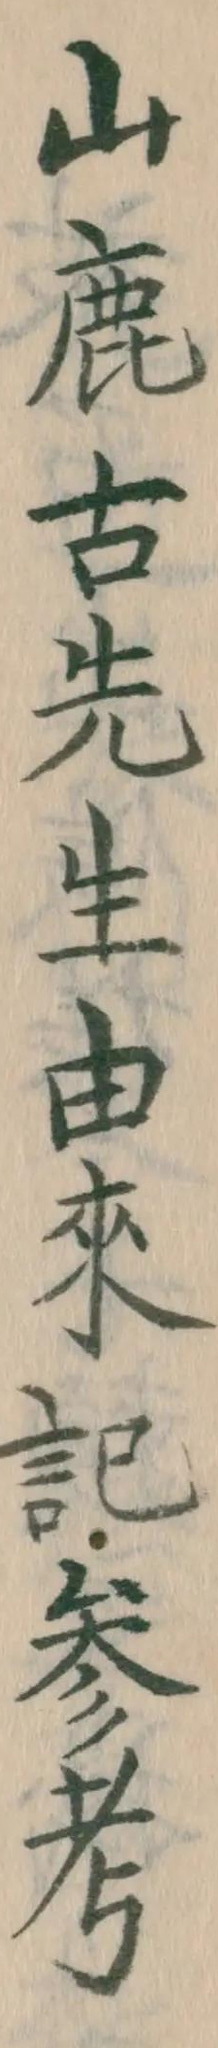山鹿古先生由来記参考
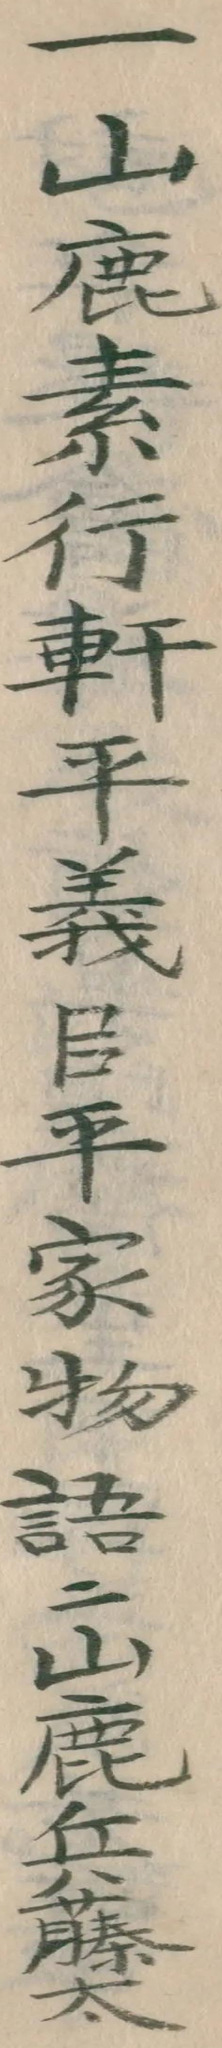一山鹿素行軒平義平家物語ニ山鹿兵藤太
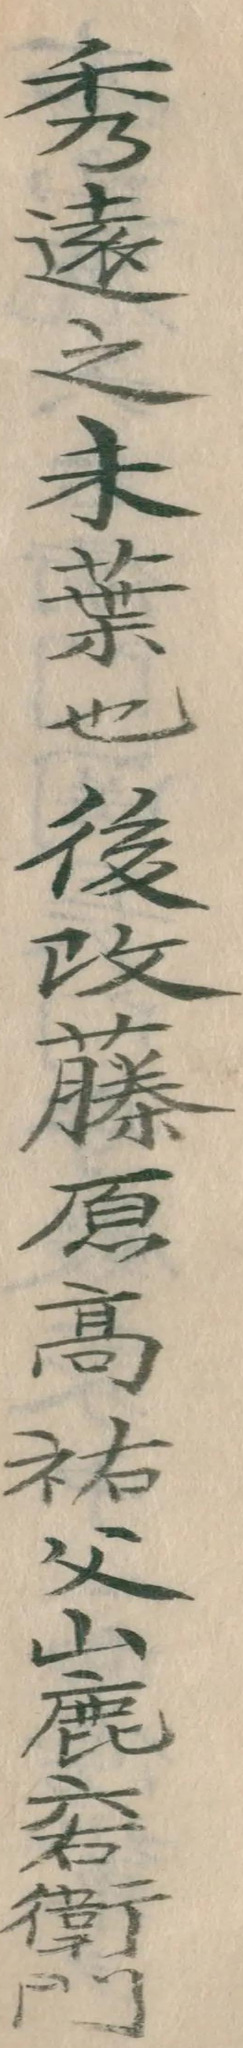秀遠之末葉也後改藤原髙祐父山鹿六右衛門
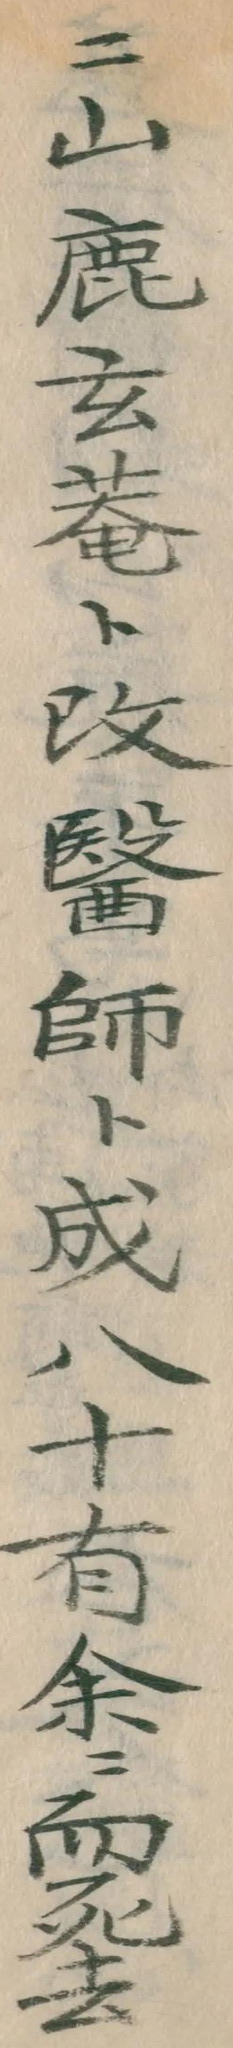ニ山鹿玄庵ト改医師ト成八十有余ニテ死去
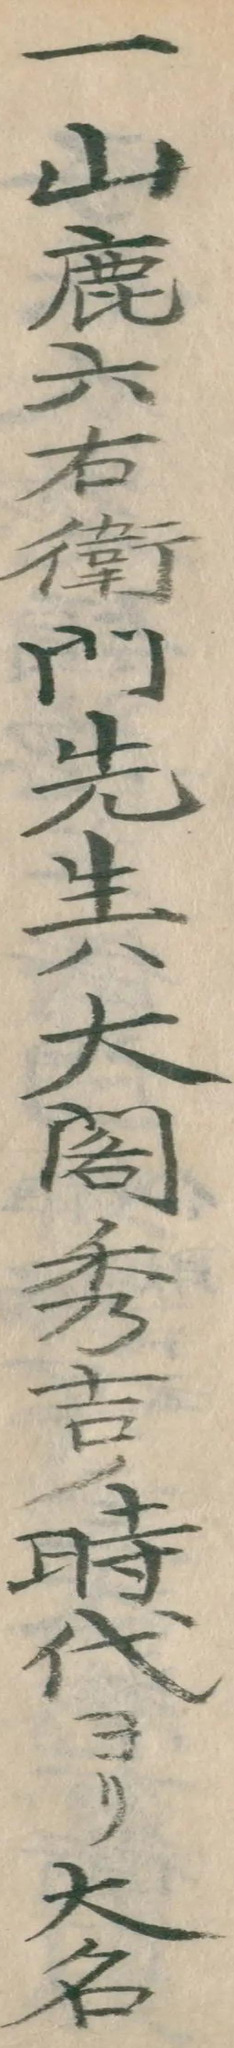一山鹿六右衛門先生ハ太閤秀吉時代ヨリ大名
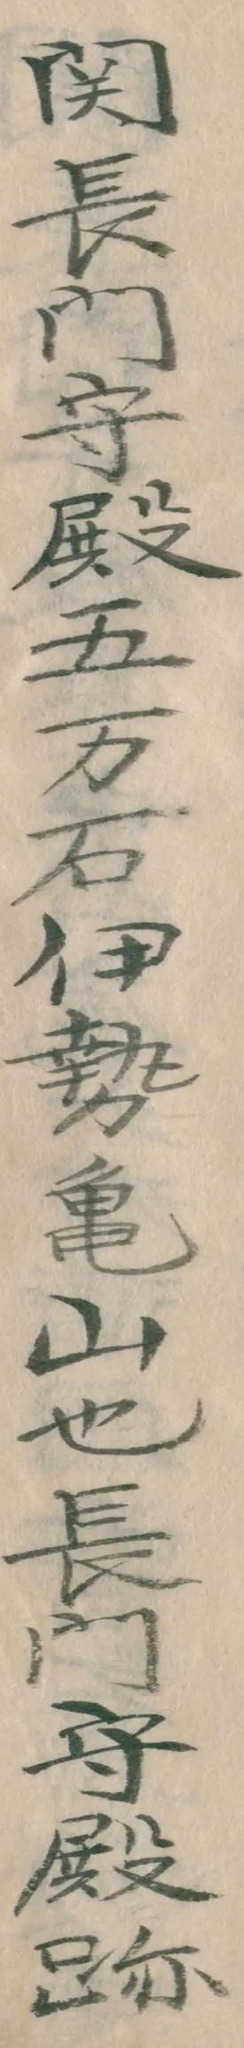関長門守殿五万石伊勢亀山也長門守殿跡
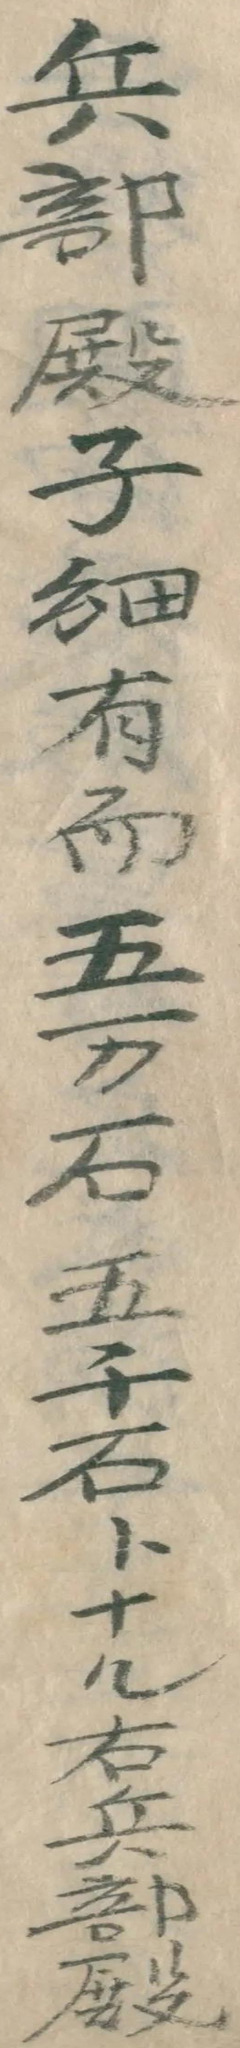兵部殿子細有テ五万石五千石トナル右兵部殿
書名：輪池叢書. 12
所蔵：国立国会図書館 National Diet Library, JAPAN
